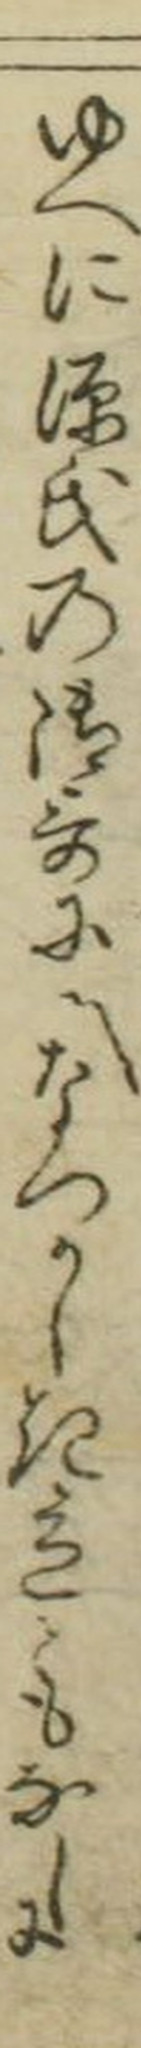ゆへに源氏の御歌に「なつかしき色ともなしに
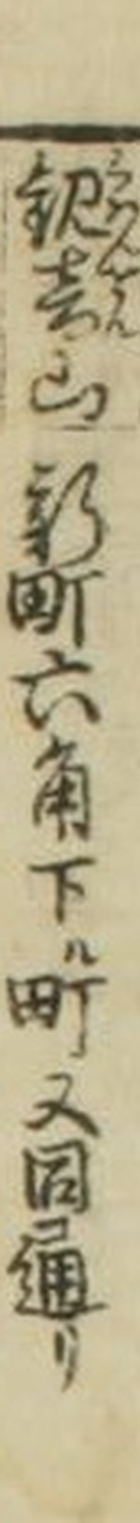観音山新町六角下ル町又同通り
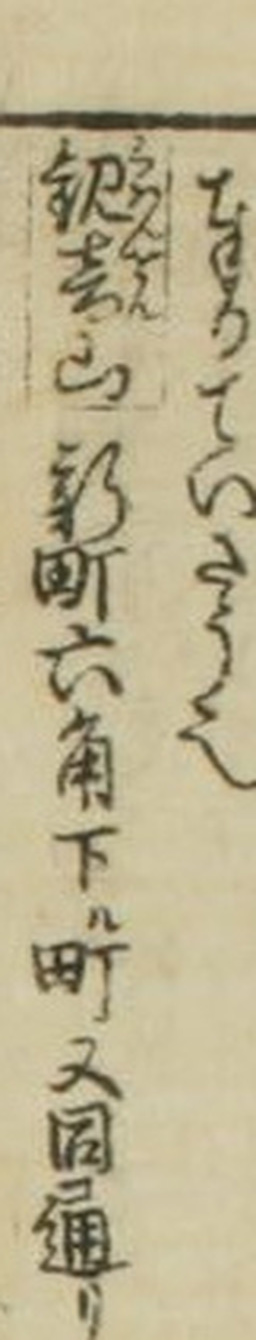観音山新町六角下ル町又同通り
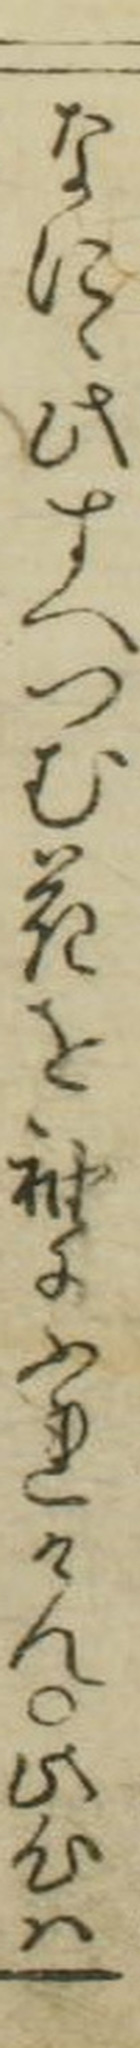なにゝ此すへつむ花を袖にふれけん」此心ハ
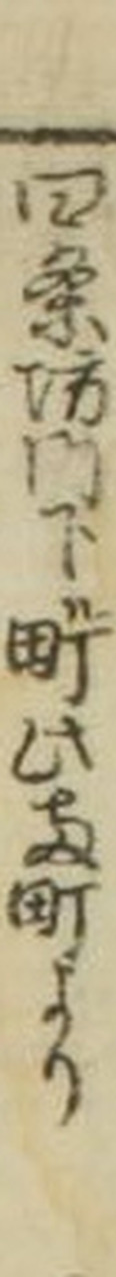四条坊門下ル町此両町より
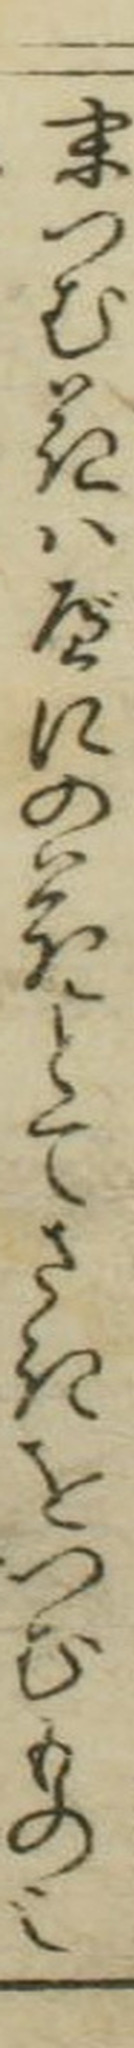末つむ花ハべにの花とてさきをつむもの也
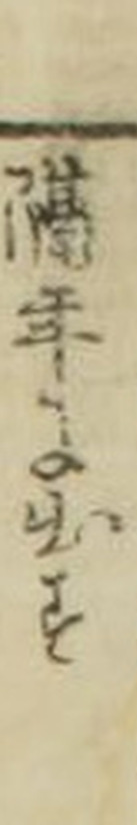隔年に出す
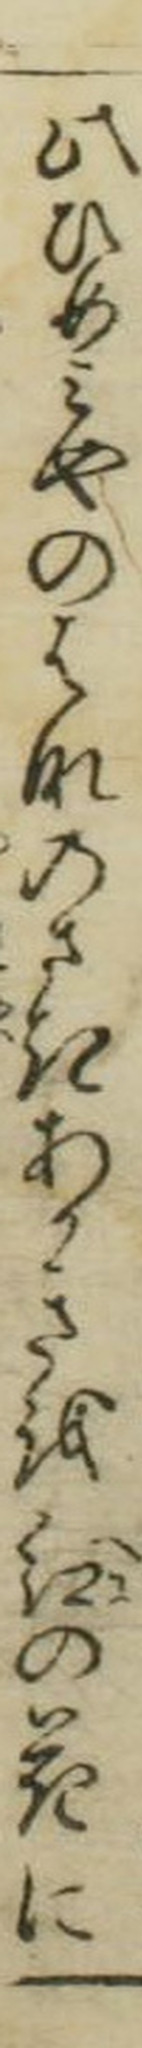此ひめミやのはなのさきあかきを紅の花に
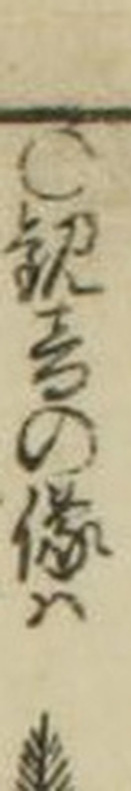◯観音の像ハ
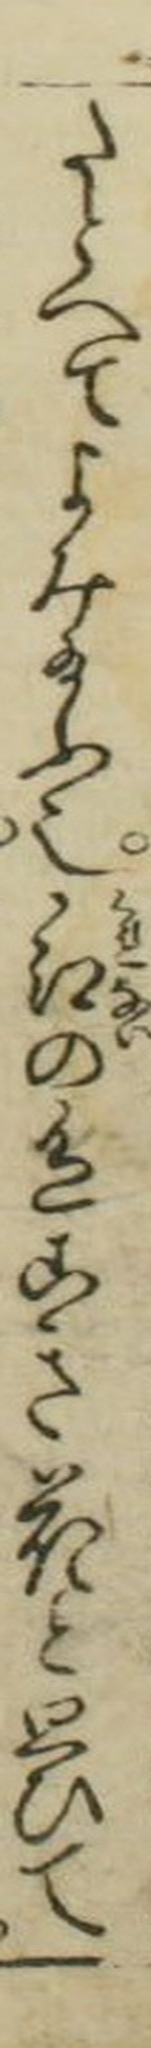たとへてよみ給ふ也。紅の色こき花と思ひて
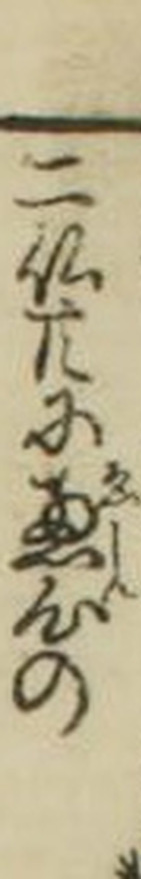二仏共に恵心の
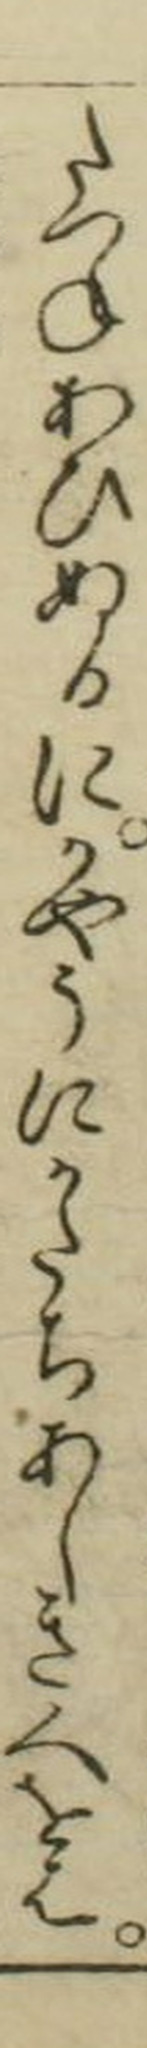たつねあひぬるに。かやうにかたちあしき人をは。
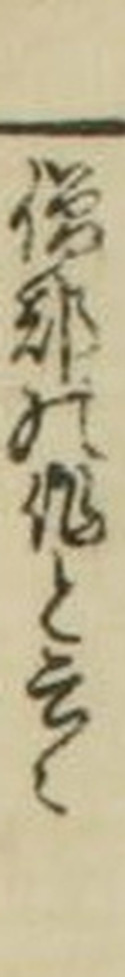僧都の作と云也
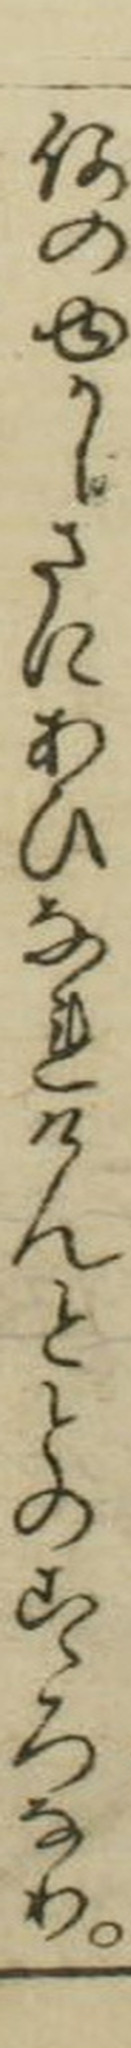何のゆかしさにあひなれけんととのこゝろなり。
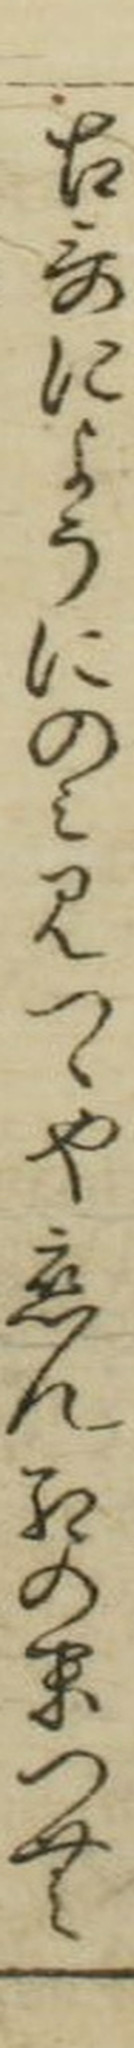古歌によそにのミ見つゝや恋ん紅の末つむ
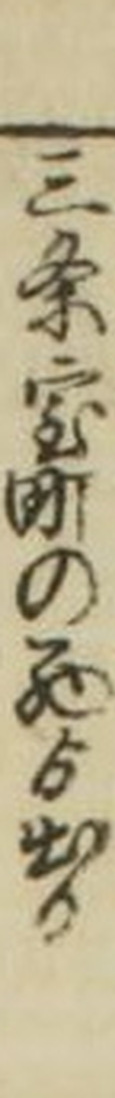三条室町の西より出る
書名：女源氏教訓鑑
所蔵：東京学芸大学附属図書館
